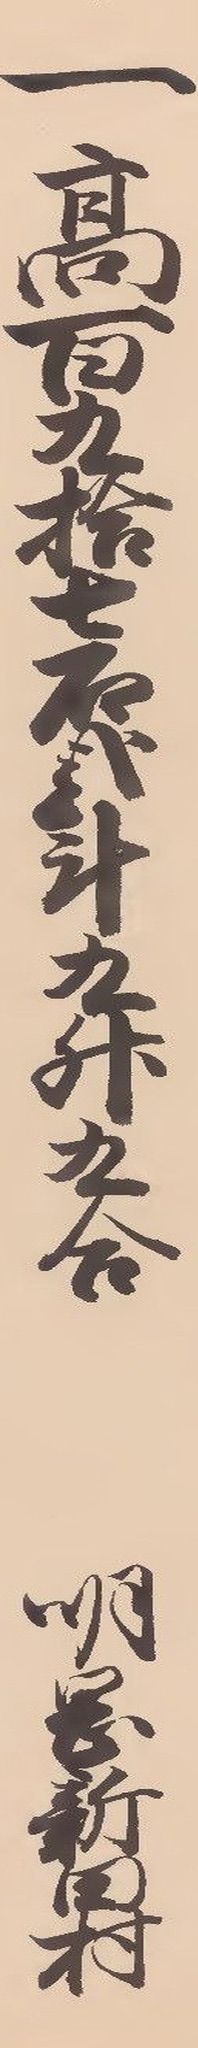一高百九拾七石弐斗九升九合明岡新田村
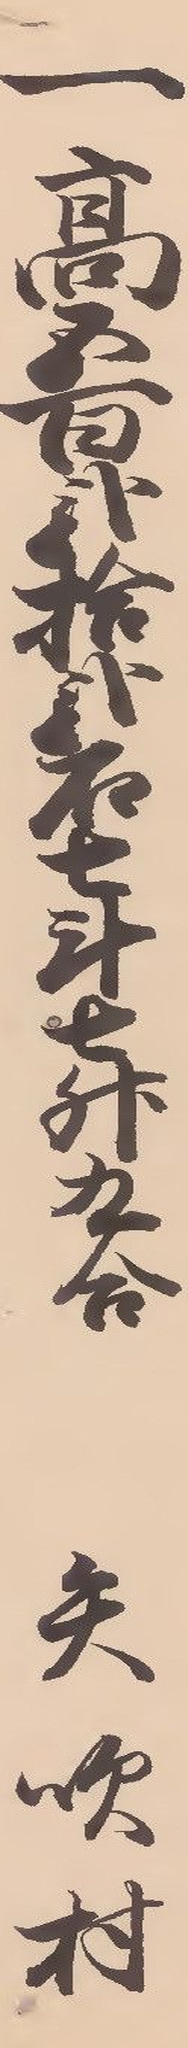一高五百弐拾弐石七斗七升九合矢吹村
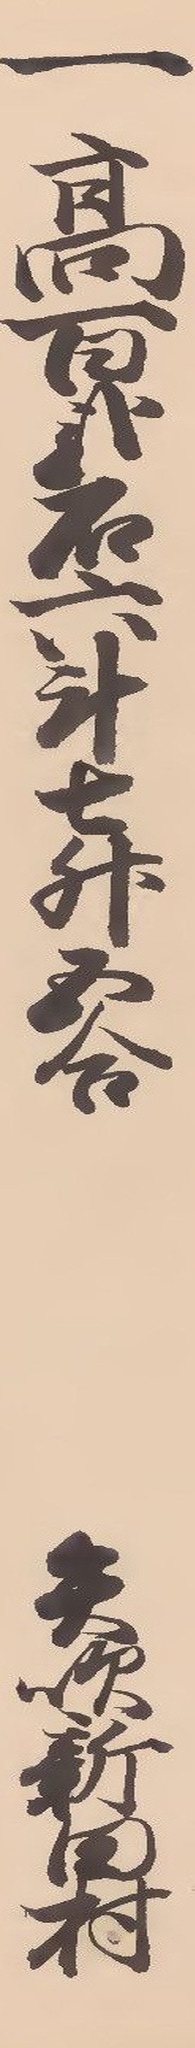一高百弐石六斗七升五合失吹新田村
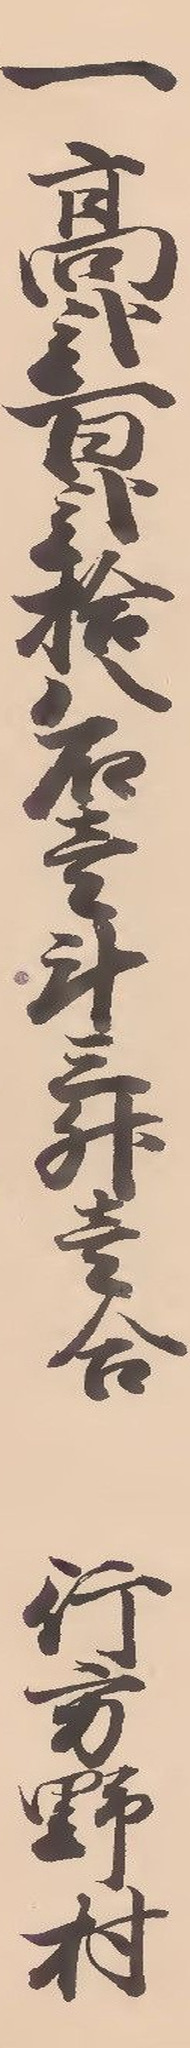一高弐百弐拾八石壱斗三升壱合行方野村

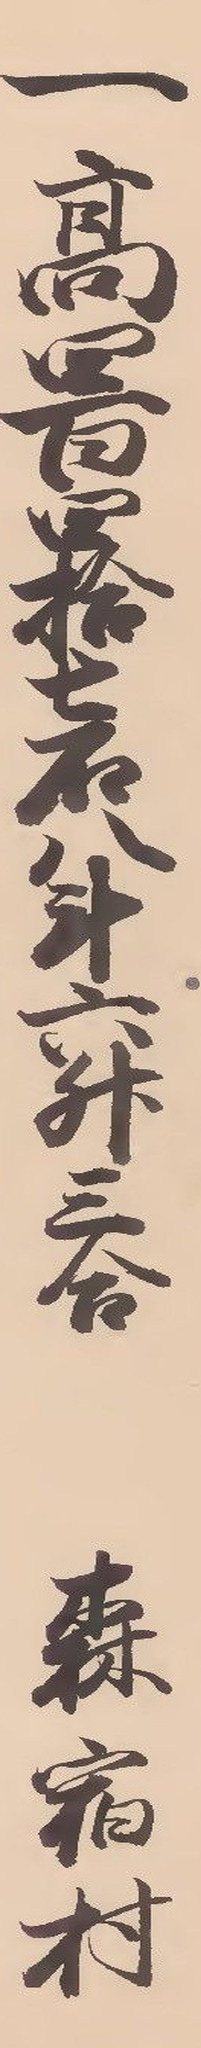一高四百四拾七石八斗六升三合森宿村
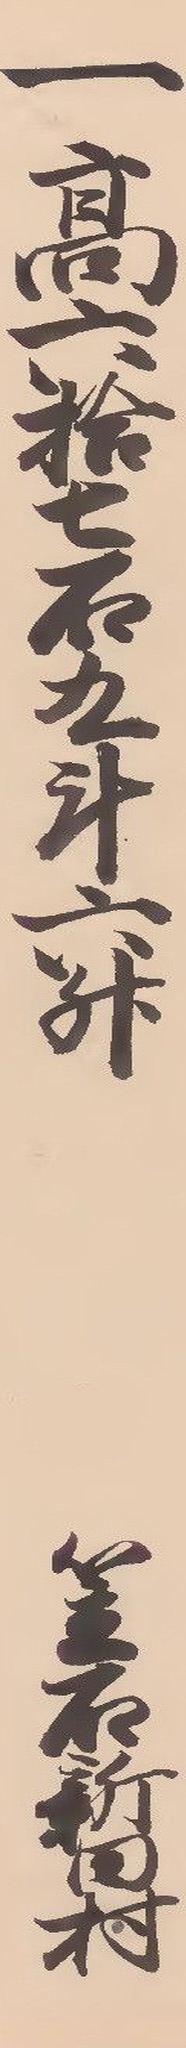一高六拾七石九斗六升笠石新田村
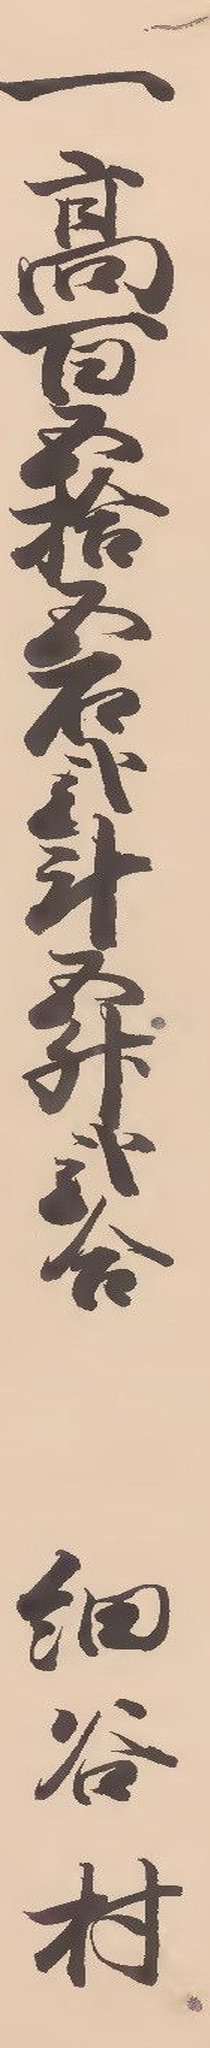一高百五拾五石弐斗五升弐合細谷村
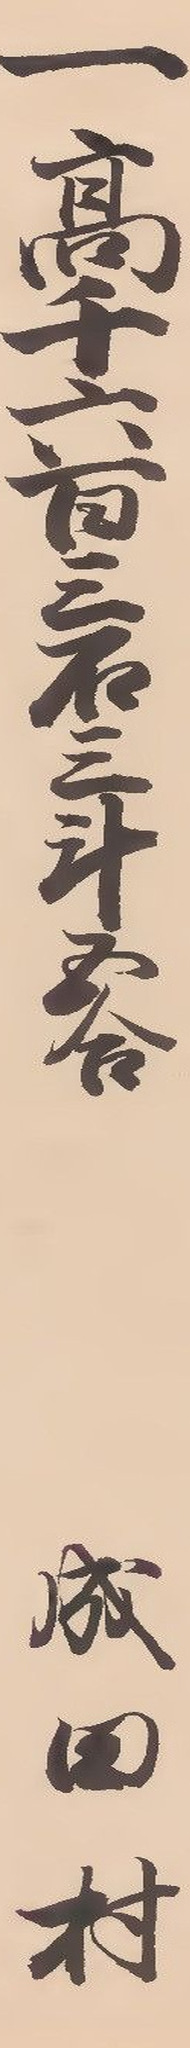一高千六百三石三斗五合成田村
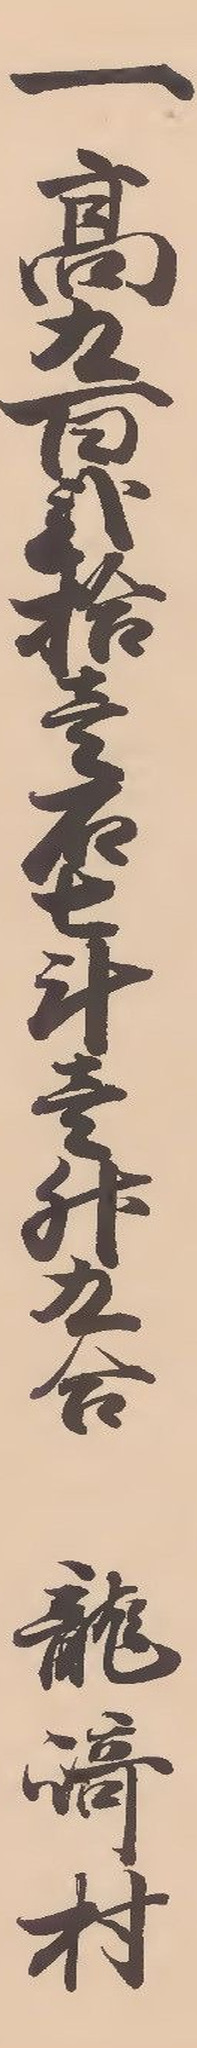一高九百弐拾壱石七斗壱升九合竜崎村
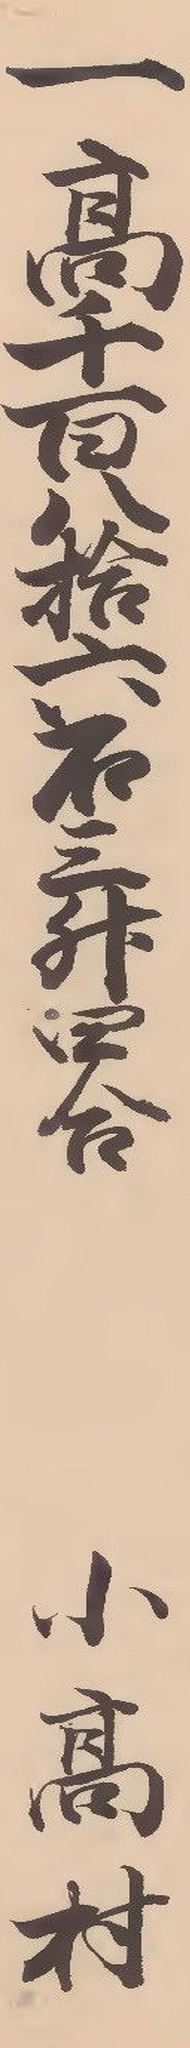一高千百八拾六石三升四合小高村
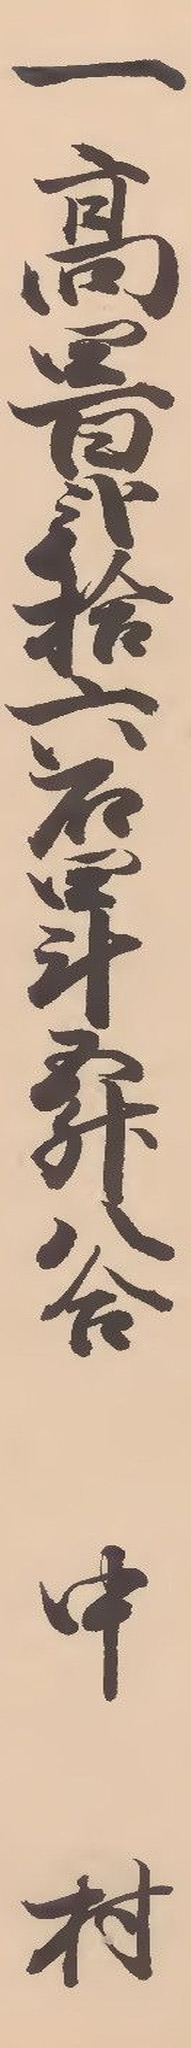一高四百弐拾六石四斗五升八合中村
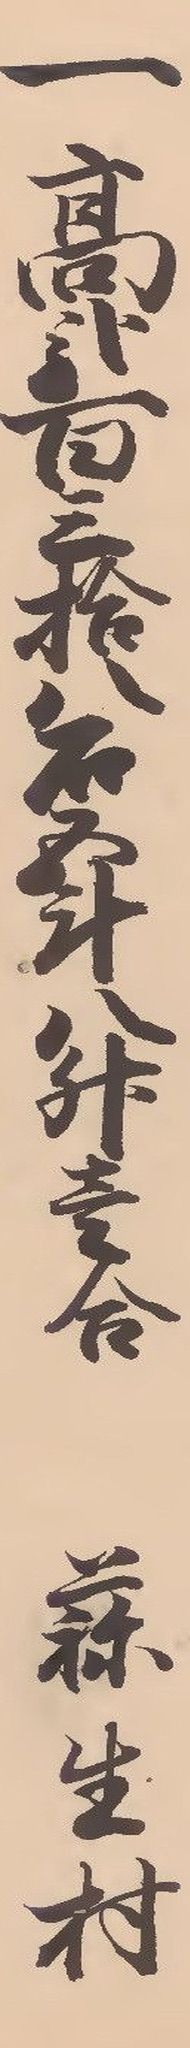一高弐百三拾八石五斗八升壱合蒜生村

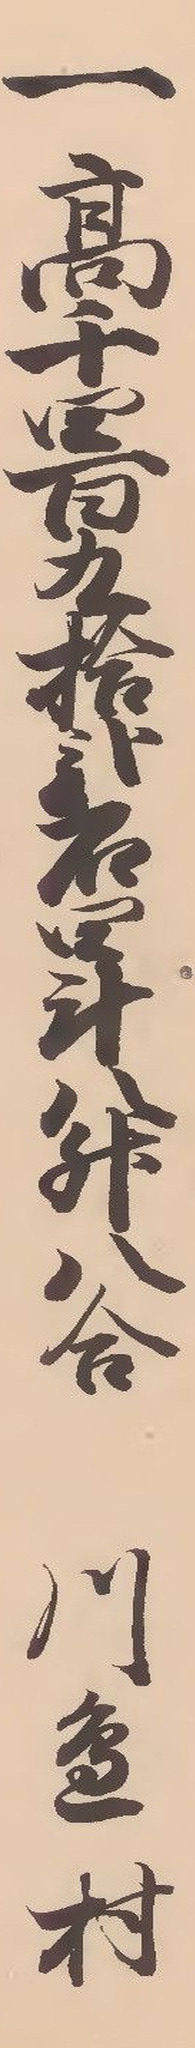一高千四百九拾弐石四斗八升八合川辺村
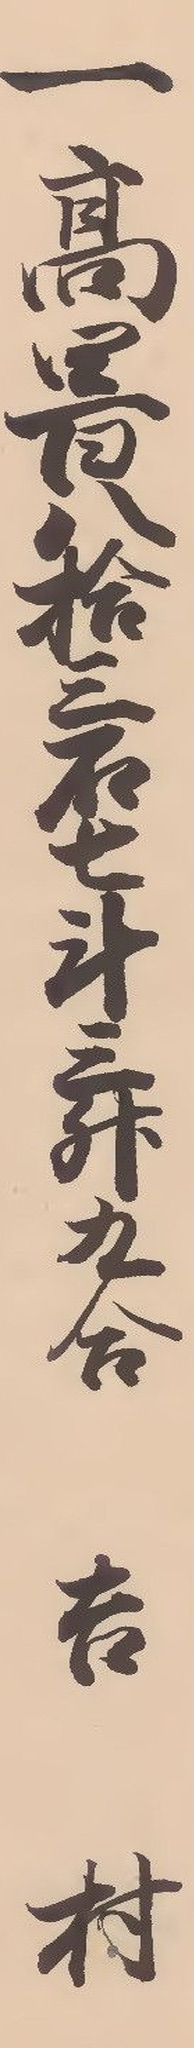一高四百八拾三石七斗三升九合吉村
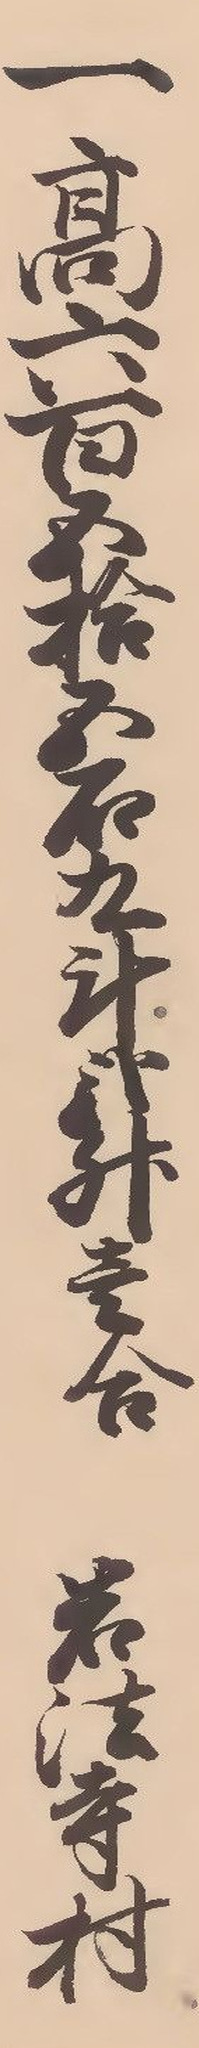一高六百五拾五石九斗弐升壱合若法寺村
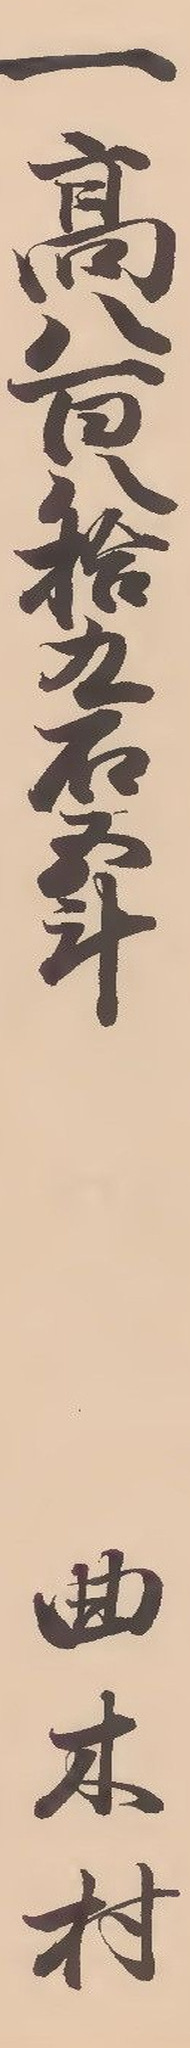一高八百八拾九石五斗曲木村
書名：陸奥国郷帳　２
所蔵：国立公文書館 National Archives of Japan
